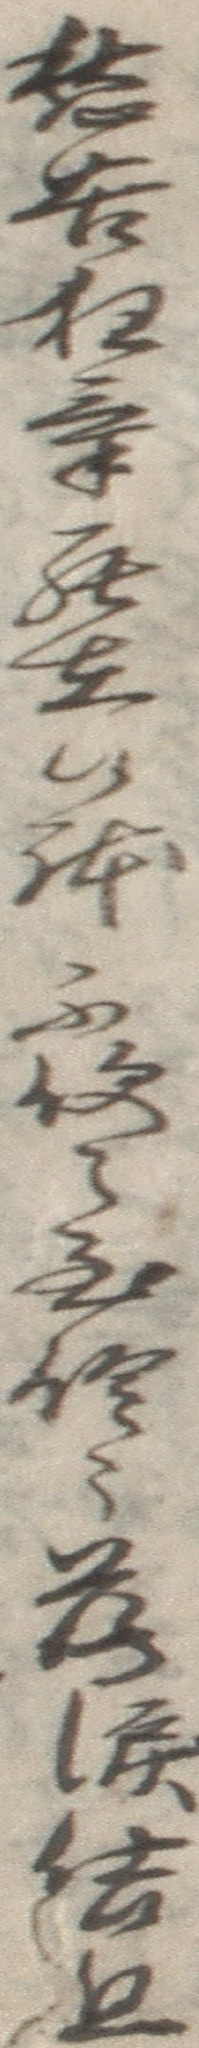愁苦狂気罷在候躰不便之至侭々落涙仕候且
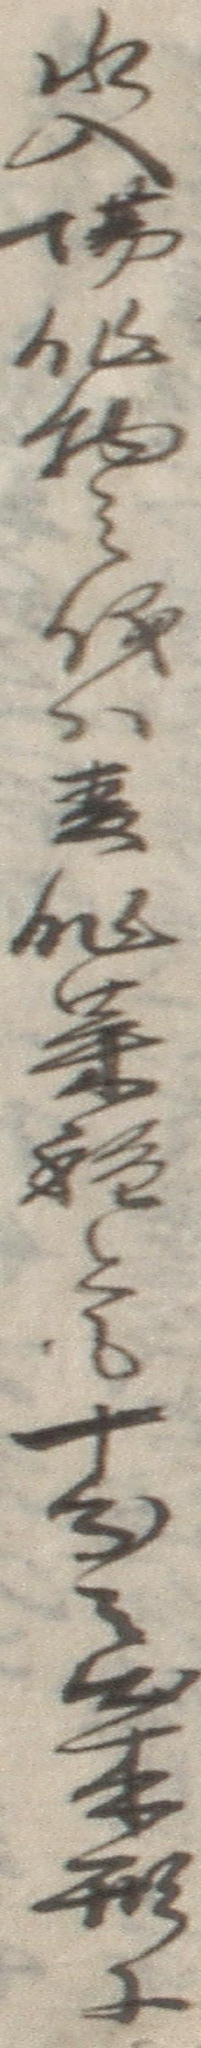水入場作物之儀ハ麦作菜種共十分之出来形に
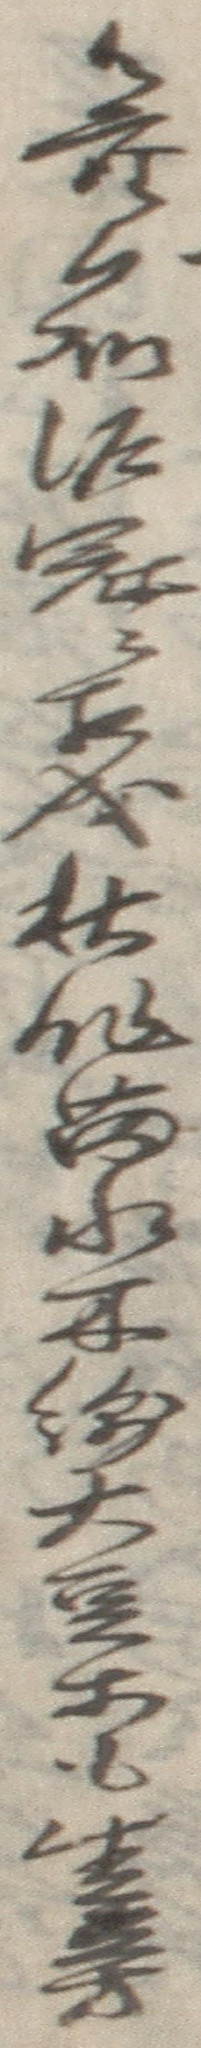御座候処泥冠二相成枯作苗水木綿大豆等も生育方

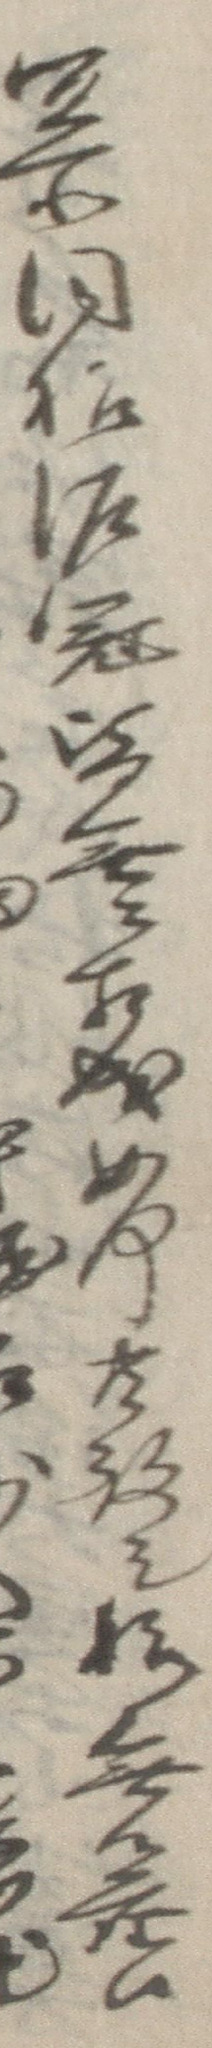宜所同様泥冠皆無二相成如何共致ㇱ様無御座候
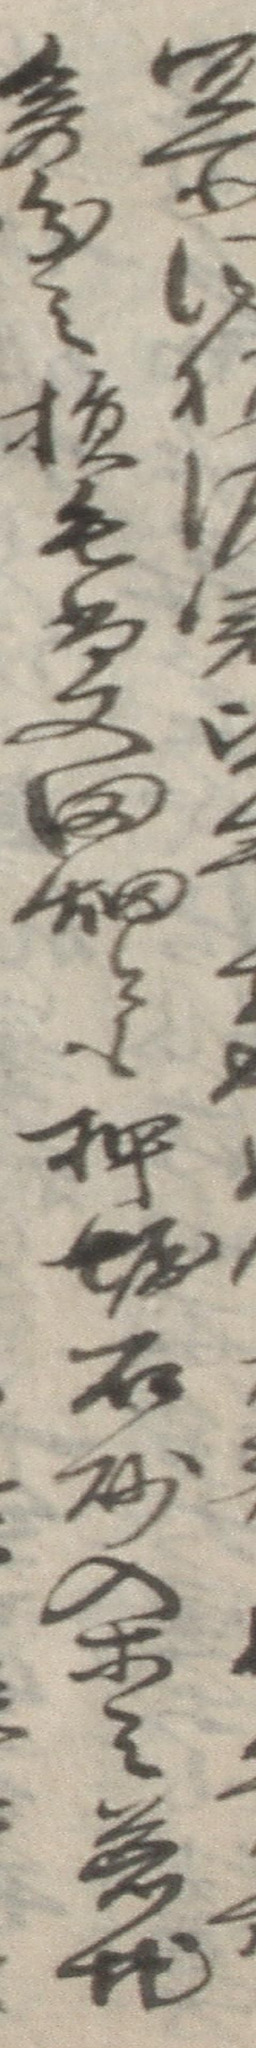多分之損毛尚又田畑とも押堀石砂入等之荒地
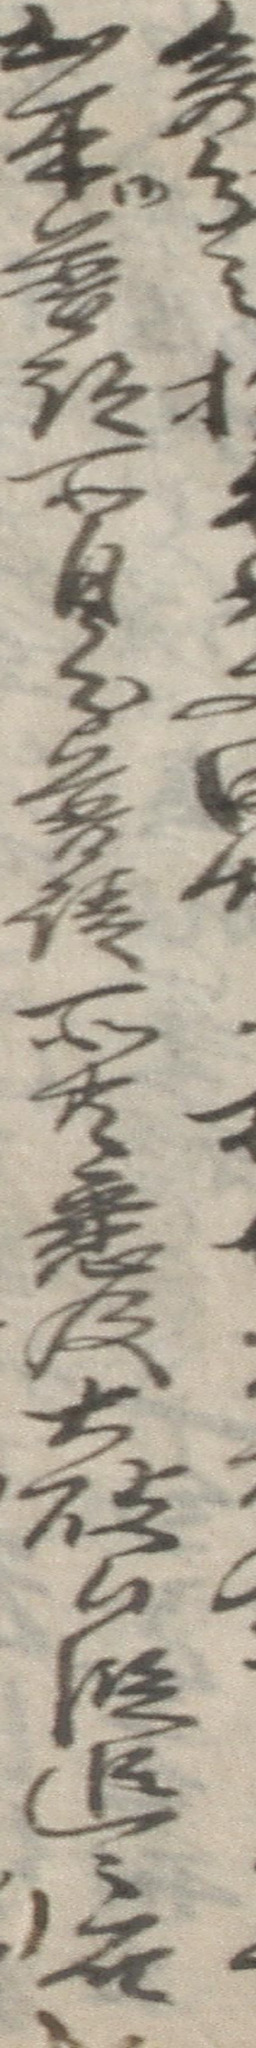出来御普請所自分普請所共悉及大破候段追々届
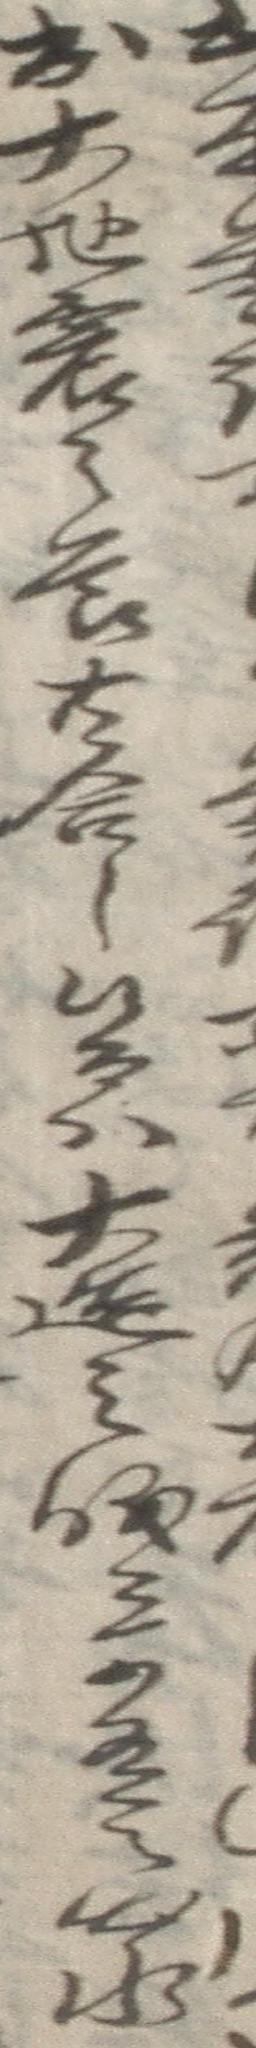出大地震之節共合し候而ハ大造之儀二可有之出水
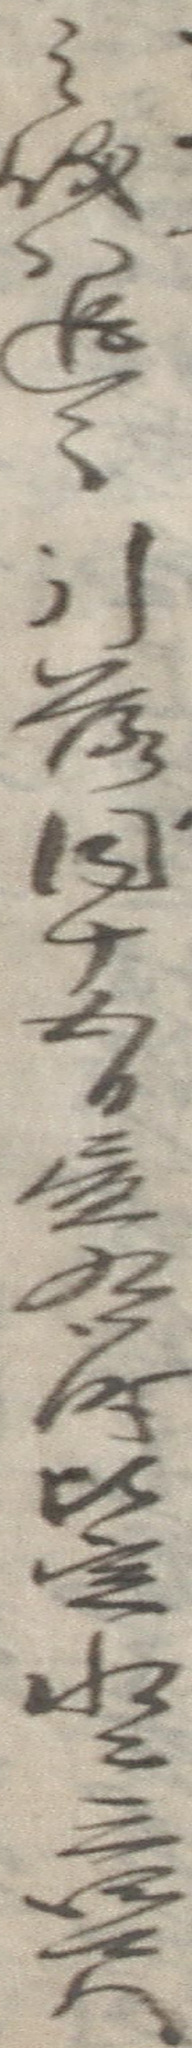之儀ハ追々引落同十五日昼九ッ時比定水二三四尺
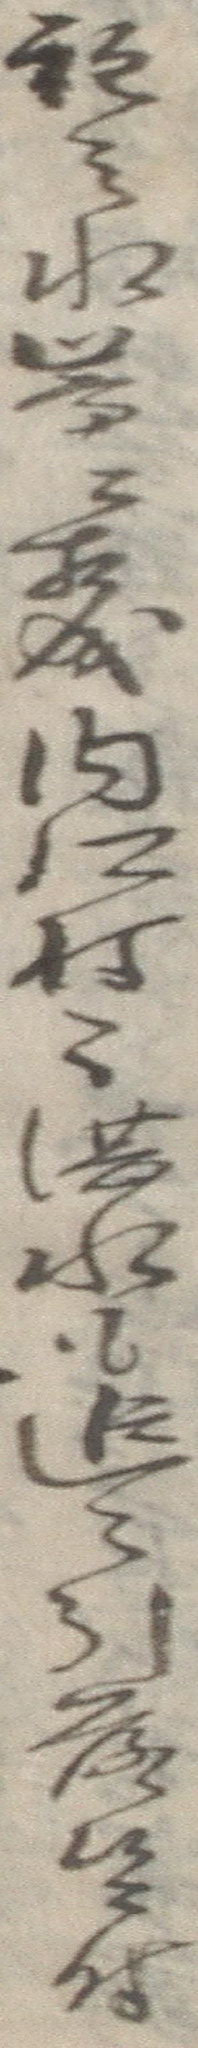程之水嵩に相成内郷村々湛水も追々引落候二付
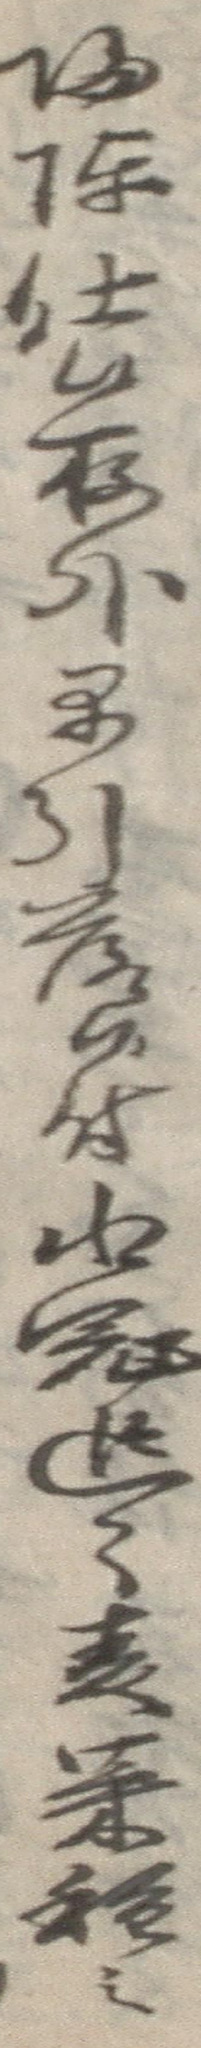帰陣仕候存外早引落候二付水冠追々麦菜種之
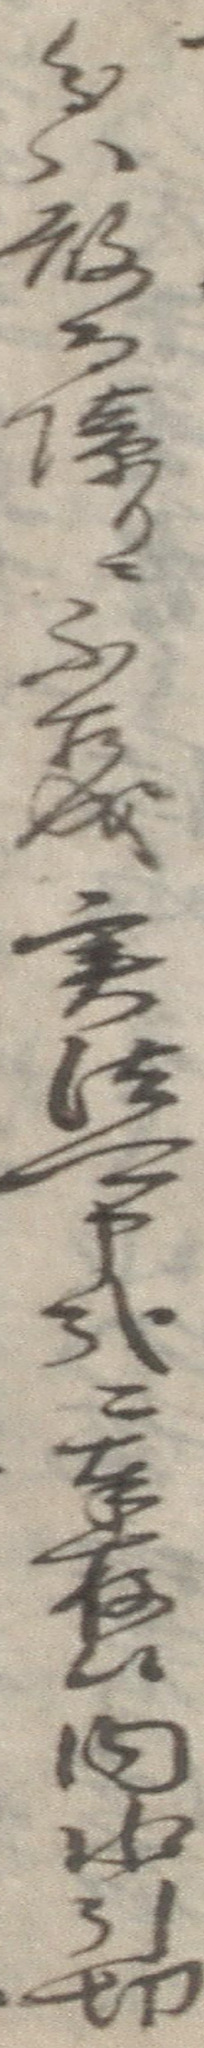分ハ敢而障り二不相成実法可申哉二奉存候内水引切
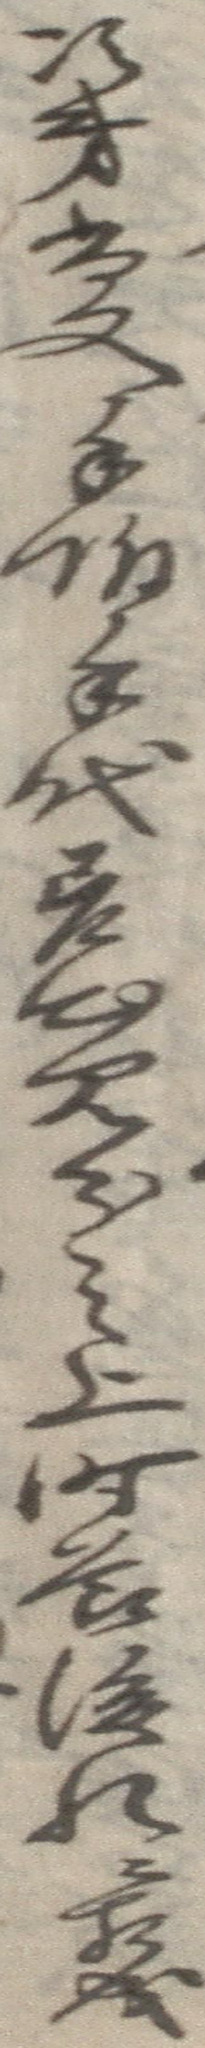次第尚又手附手代差出見分之上時節後れ二相成
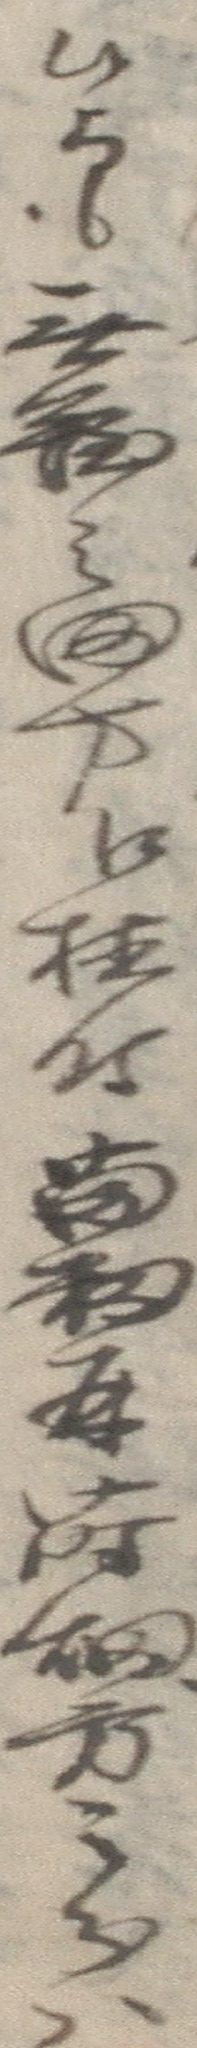候とも無難之田方江植付苗籾幷蒔畑方之分ハ
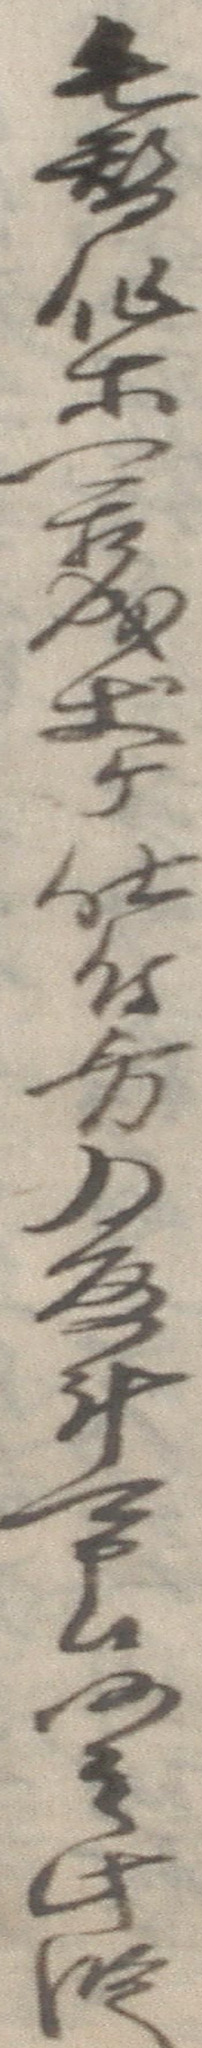もち作等可相成丈ヶ仕付方為取計可申候仍之此段
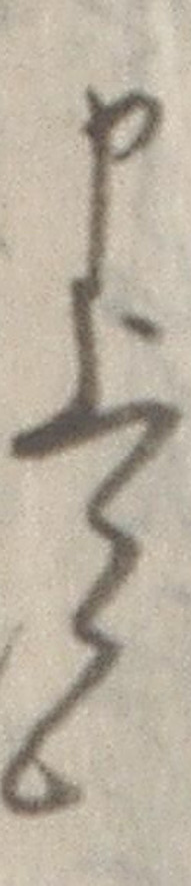申上候以上
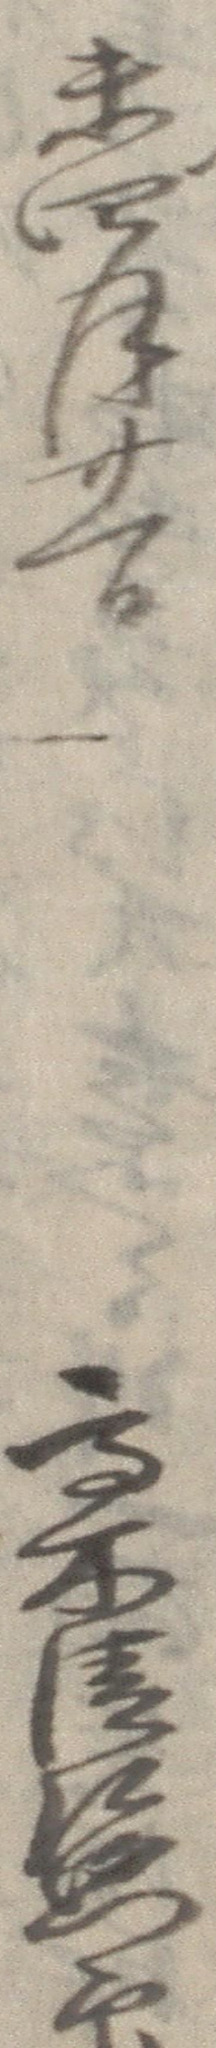未四月廿一日高木清左衛門印
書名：信州地震一件
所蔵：東京大学地震研究所図書室 Earthquake Research Institute Library, The University of Tokyo, JAPAN
